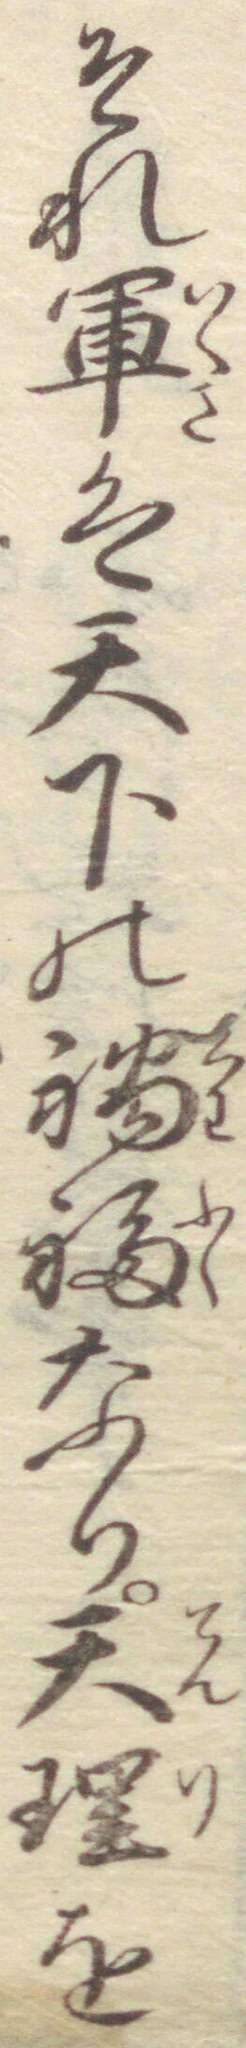それ軍は天下の禍福なり。天理を
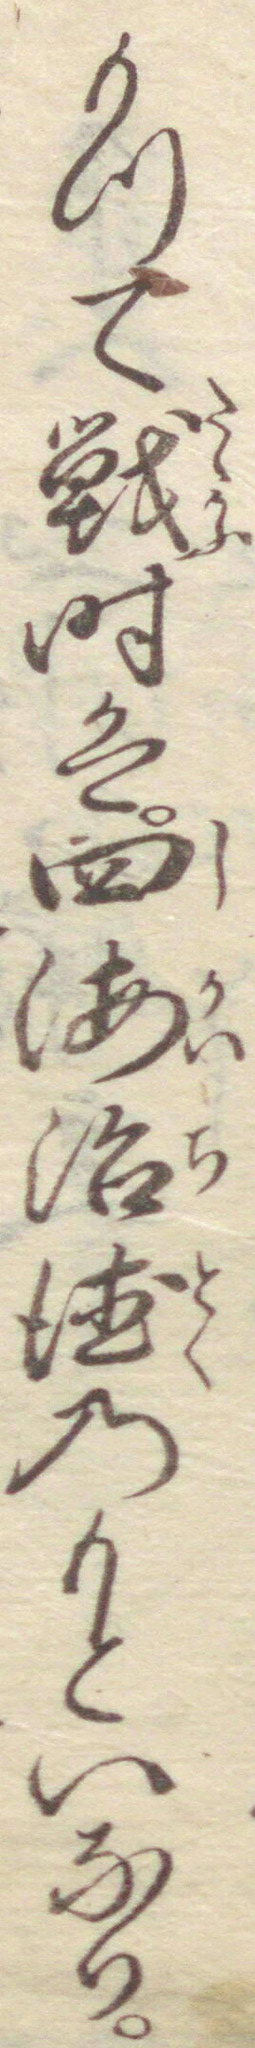もつて戦時は。四海治徳のもといなり。
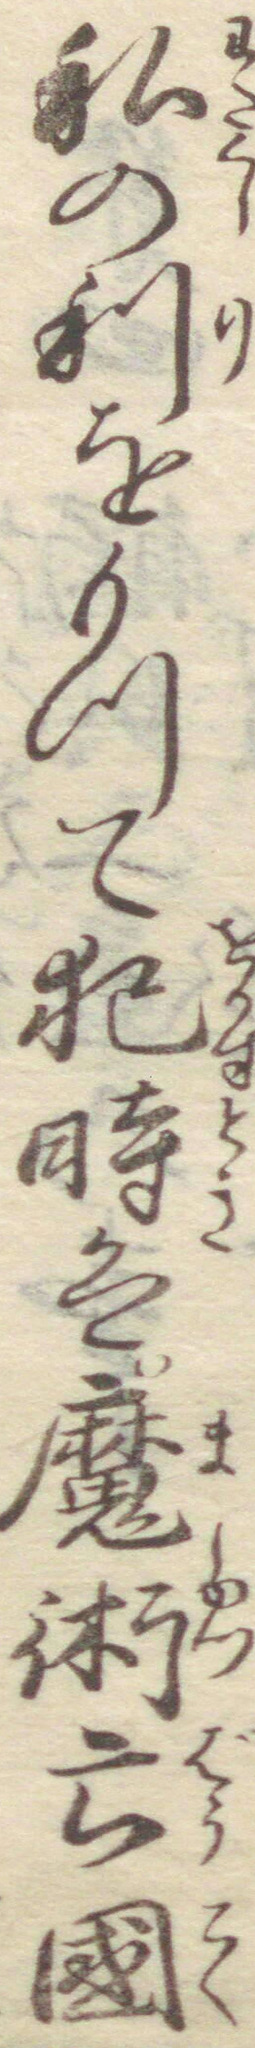私の利をもつて犯時は。魔術亡国
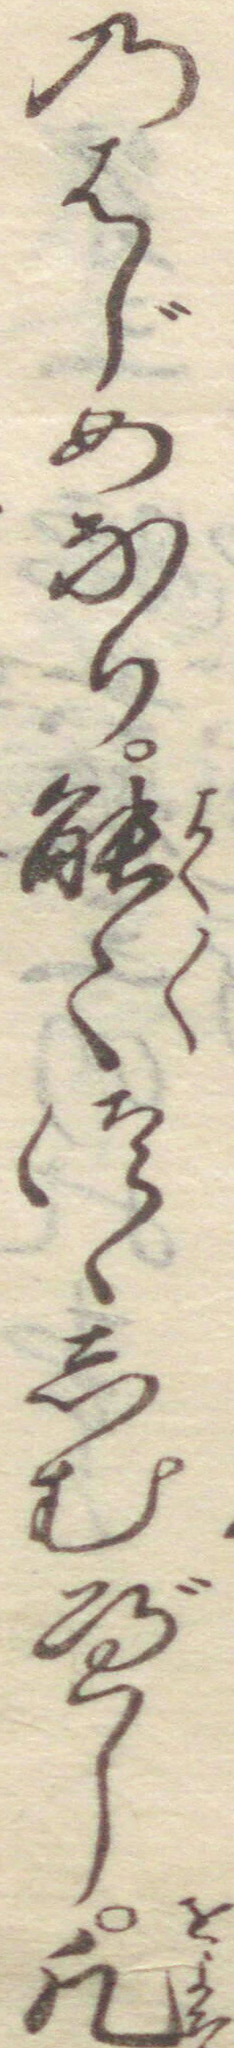のはじめなり。能々つゝしむべし。凡
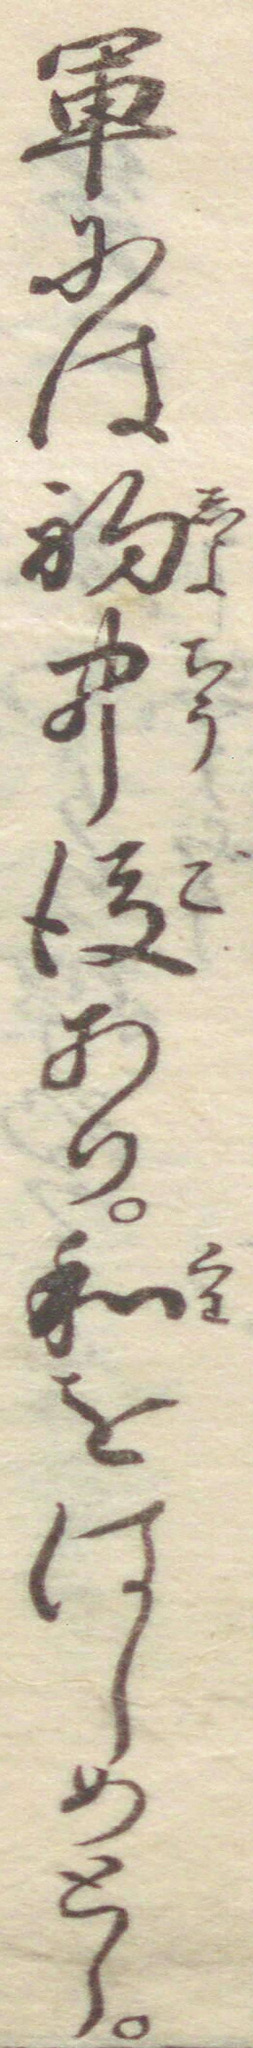軍には初中後あり。和をはしめとし。
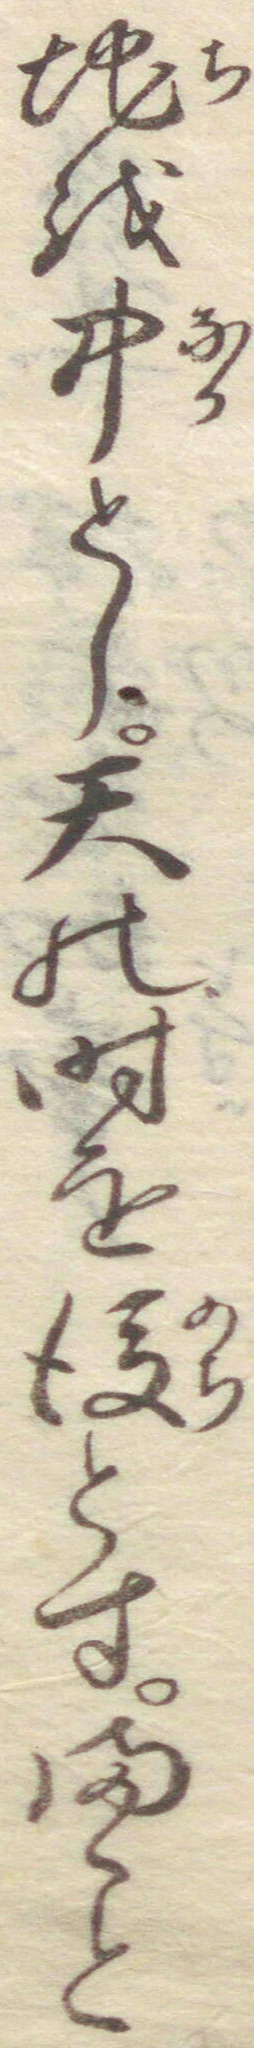地を中とし。天の時を後とす。まこと
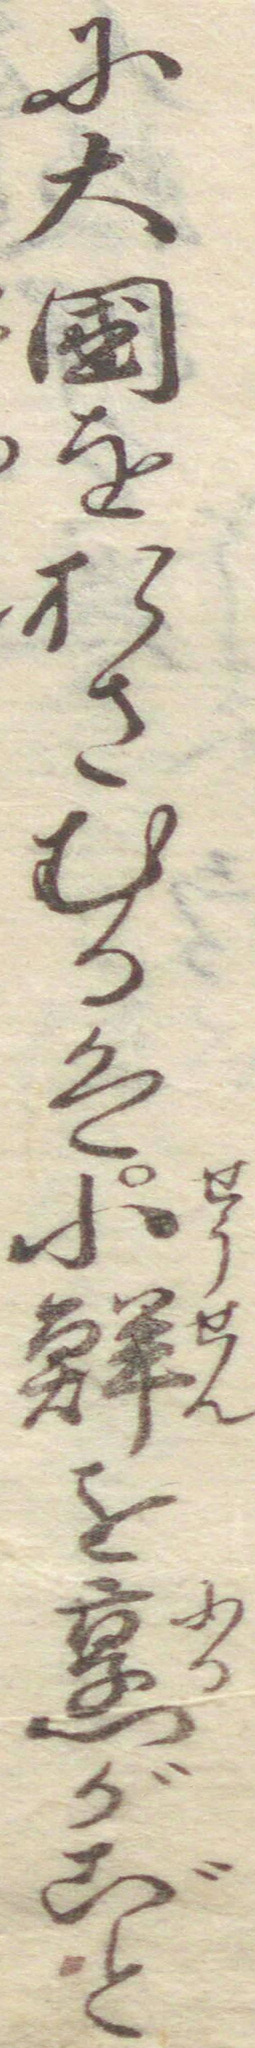に大国をおさむるは。小鮮を烹がごと
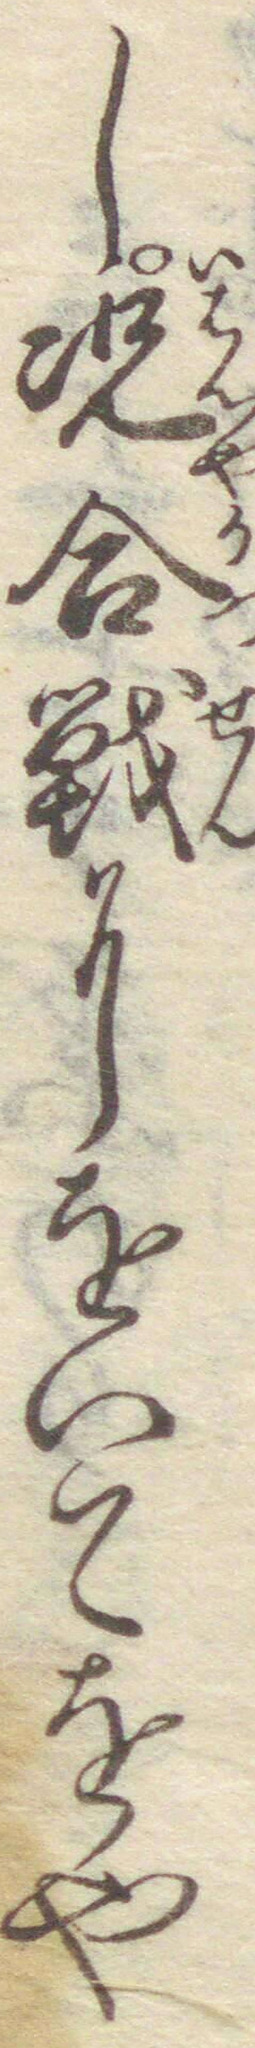し。况合戦にをいてをや

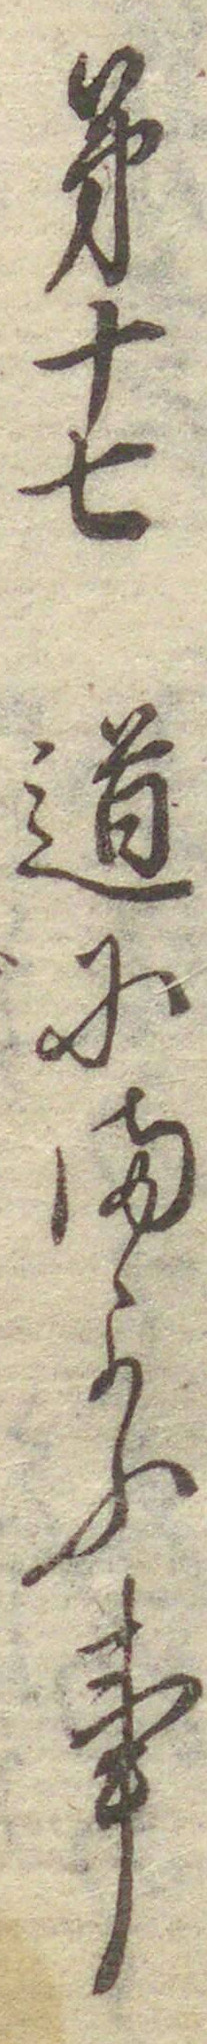第十七道にまよふ事
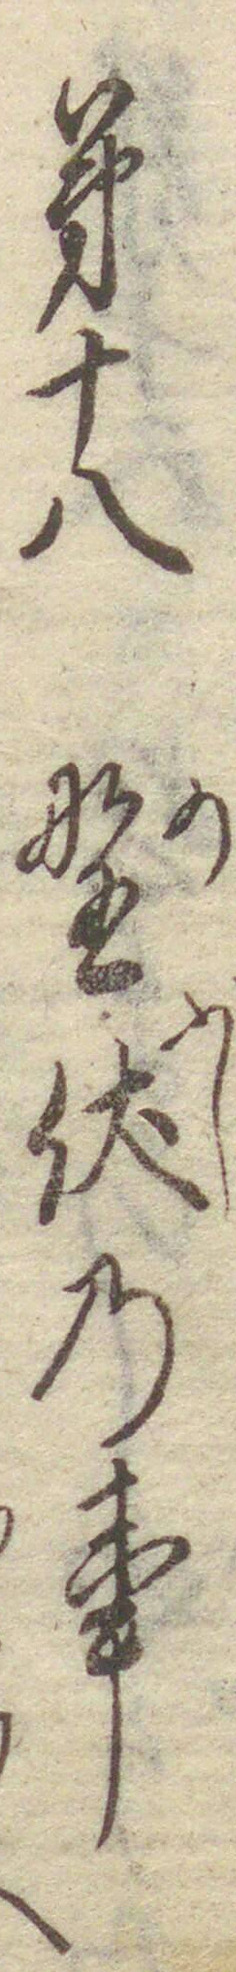第十八野伏の事
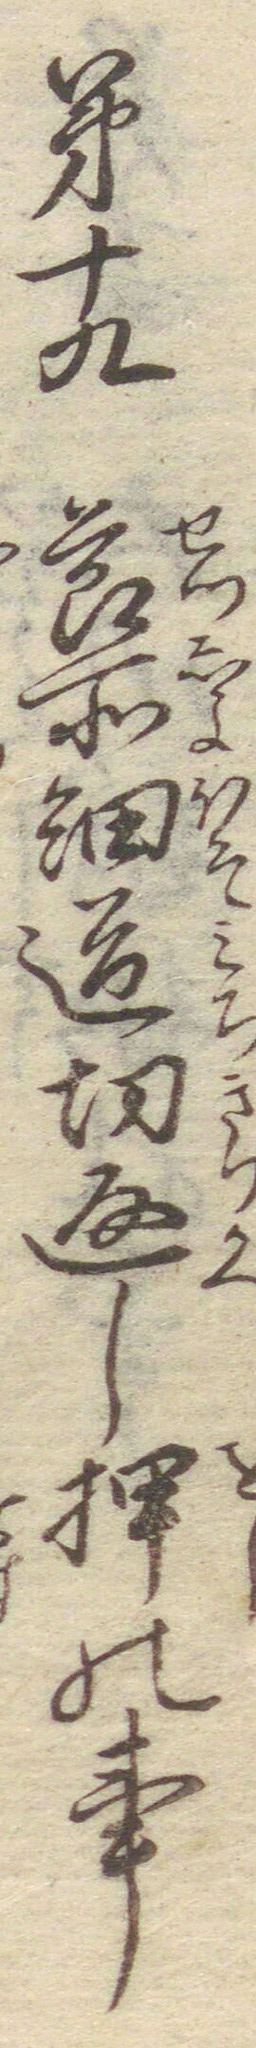第十九節所細道切返し押の事
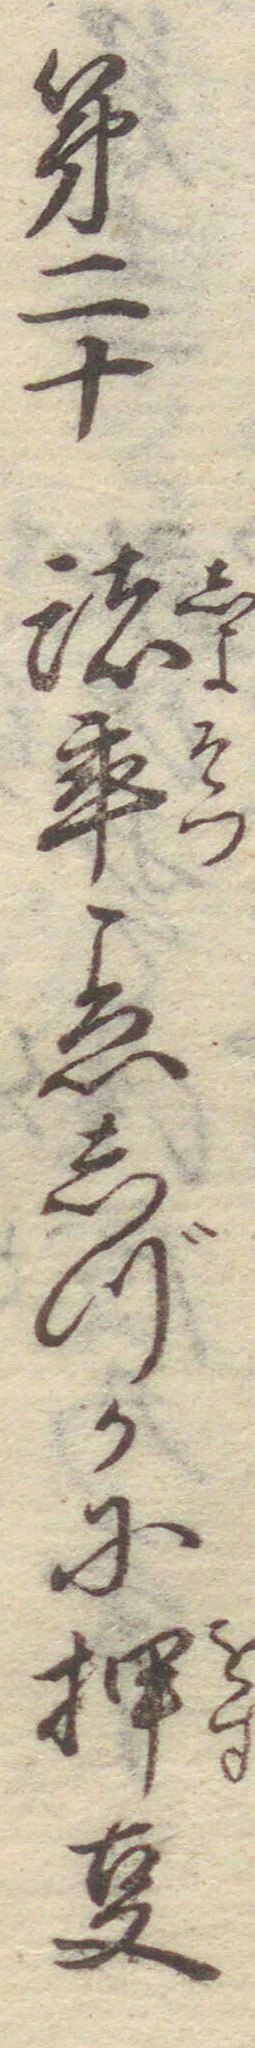第二十諸卒こゑしづかに押事
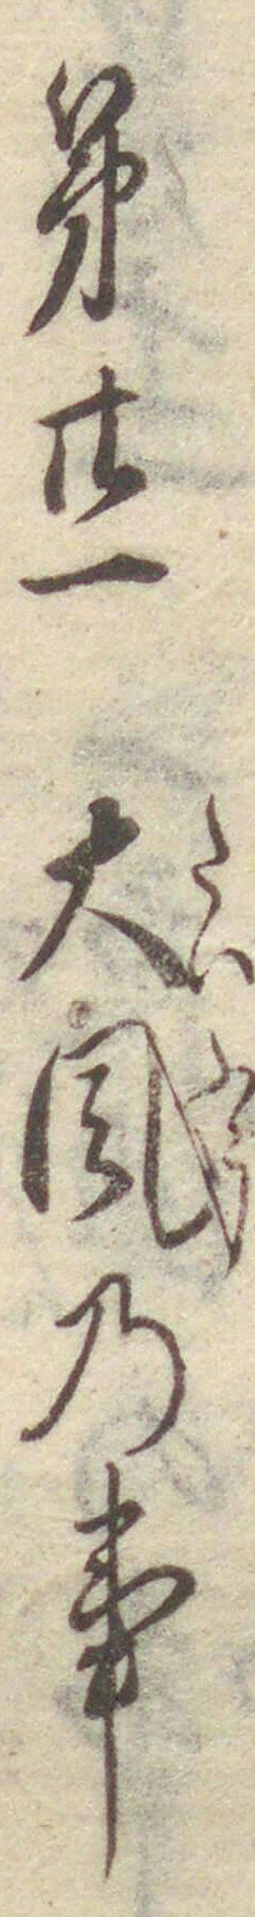第廿一大風の事
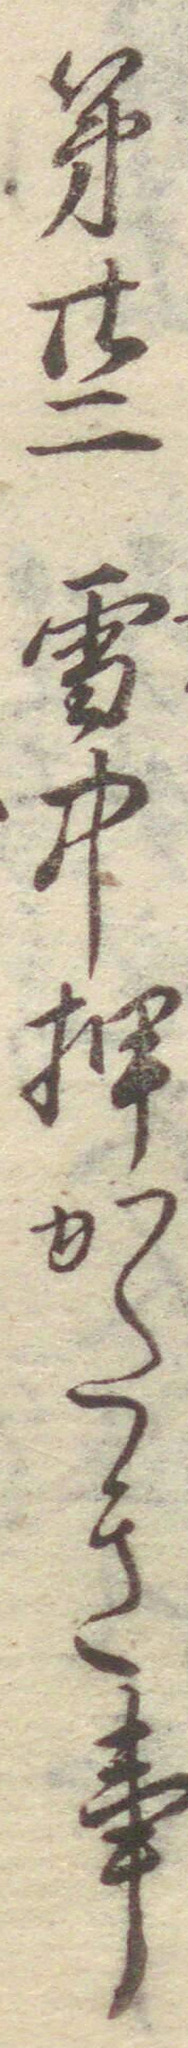第廿二雪中押がたき事
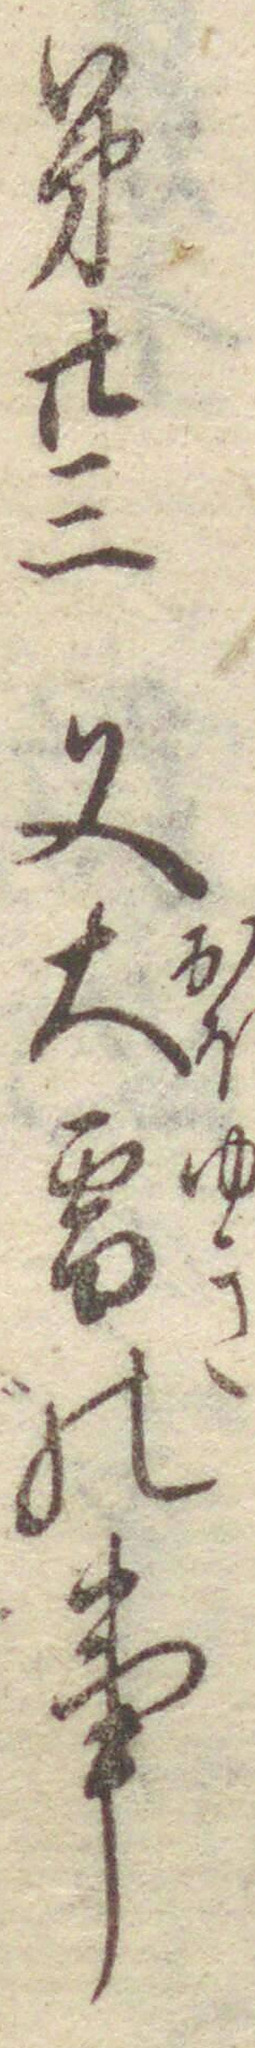第廿三又大雪の事
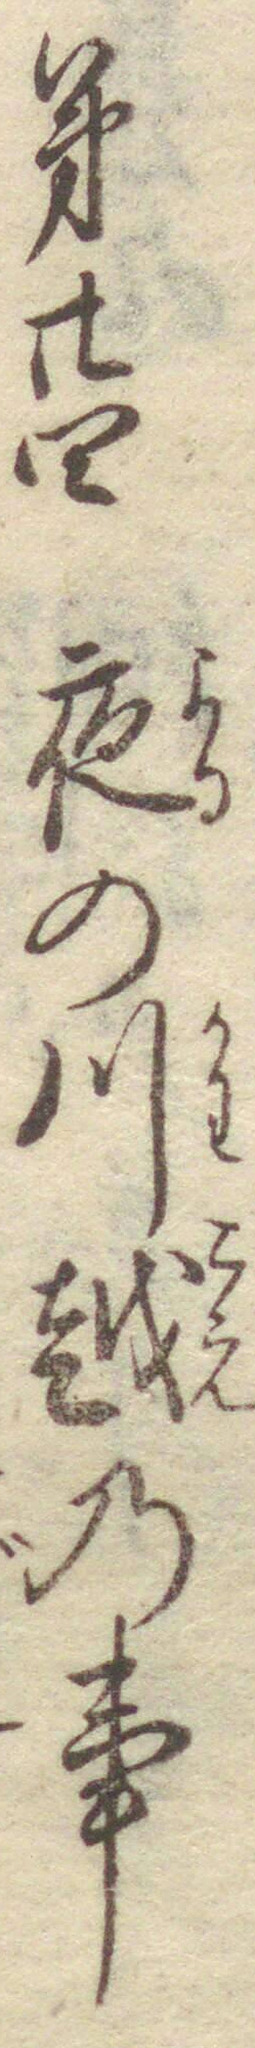第廿四夜の川越の事
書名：軍法極秘傳書
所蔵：国文学研究資料館
